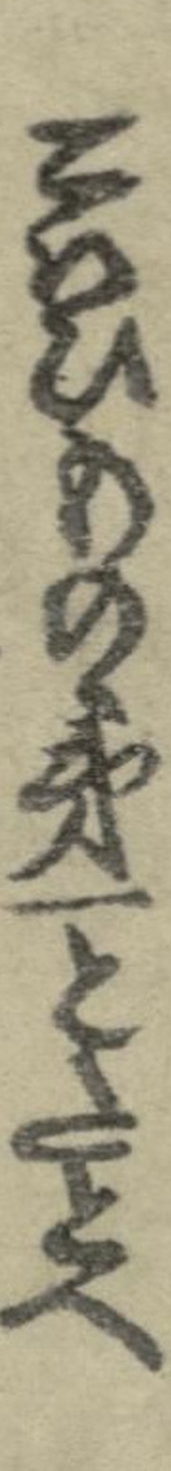こはひものゝ第一とたとへ
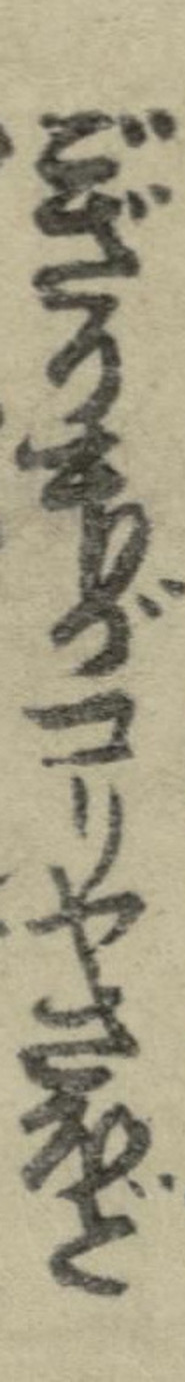ござり升がコリヤさほど
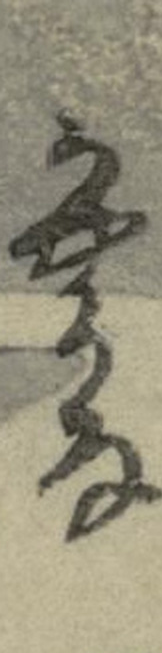かやうな
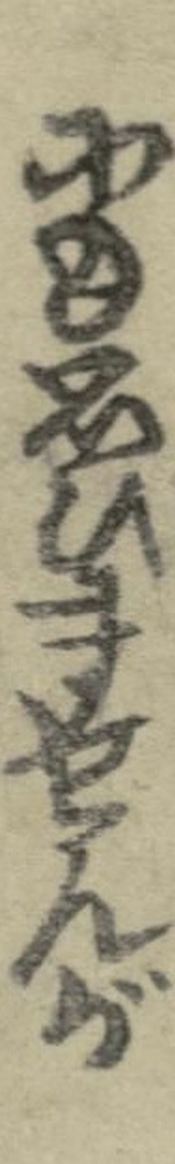にも思ひませんが
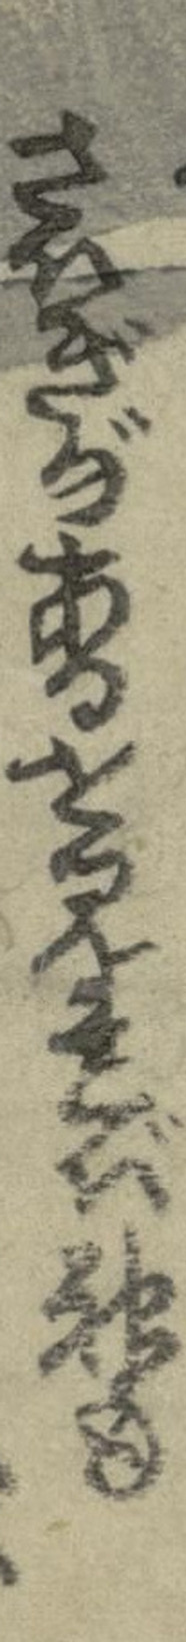さはぎがあると見れば神も
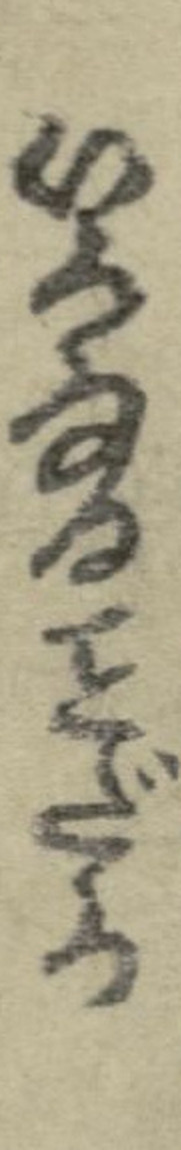いかなることだか
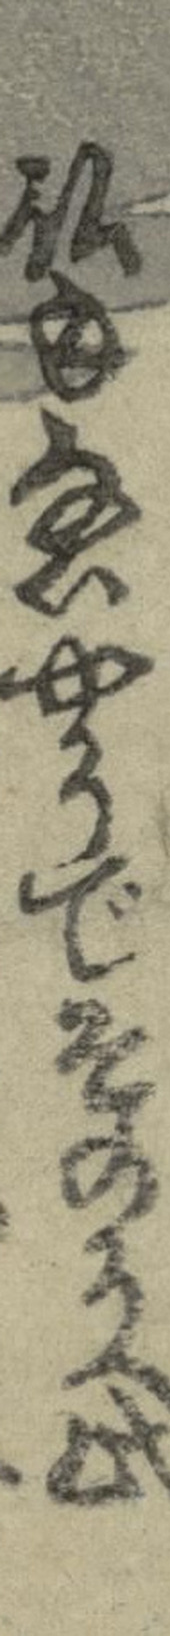仏もないやうでそのうへ此
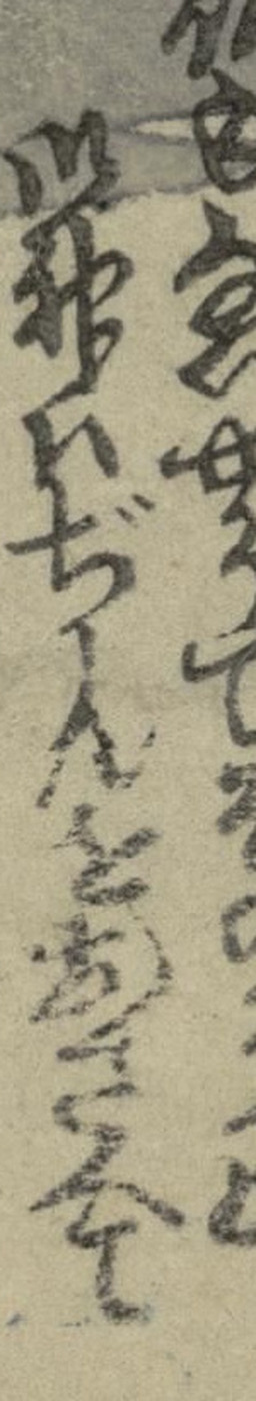御神はぢしんをおさへて
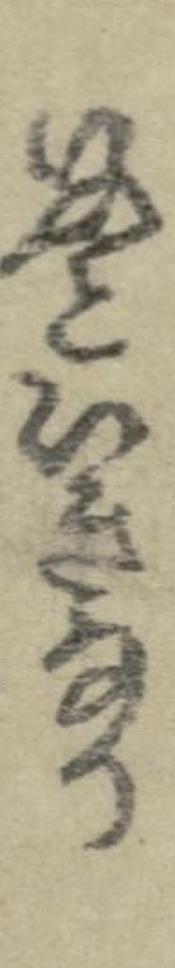いふといきなり
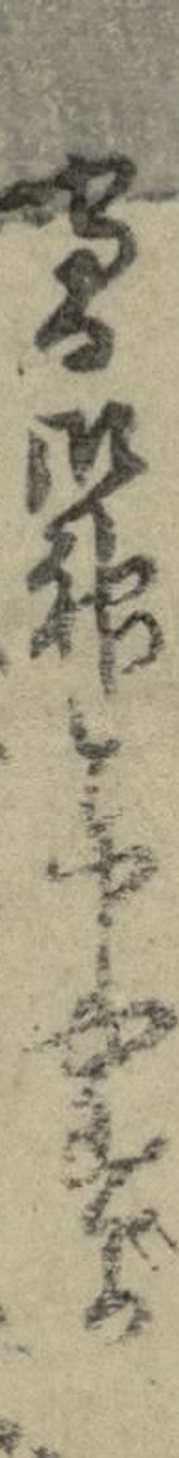守る御神と申やすが
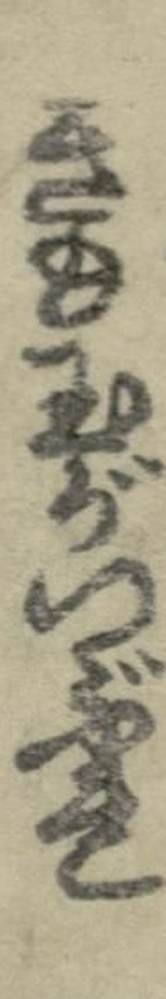きも玉がつぶれ
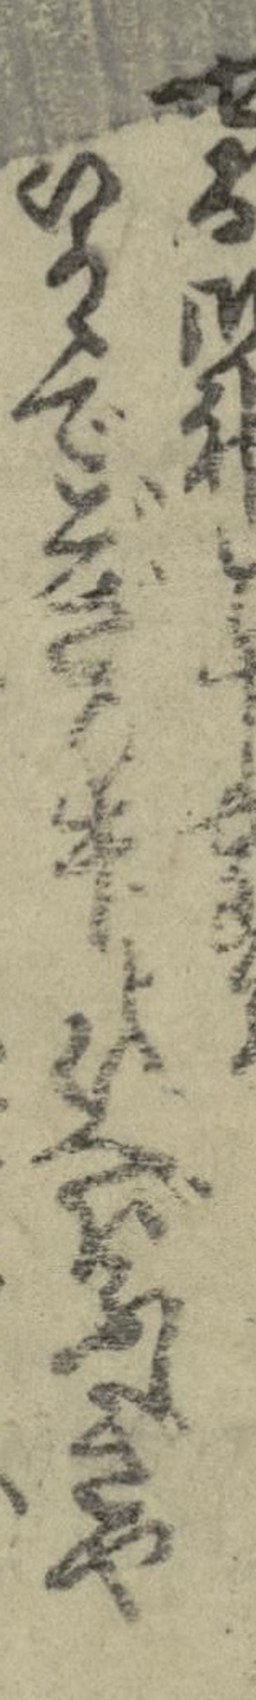いかゝでござり升トいへばふしぎや
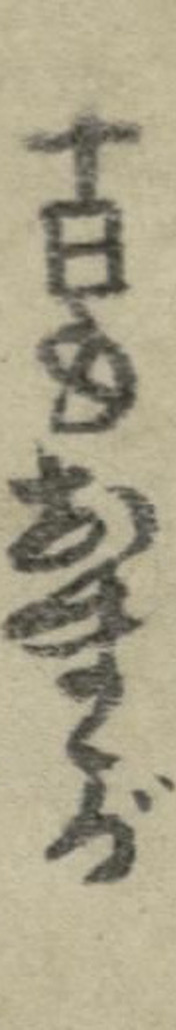十日もおまゝが
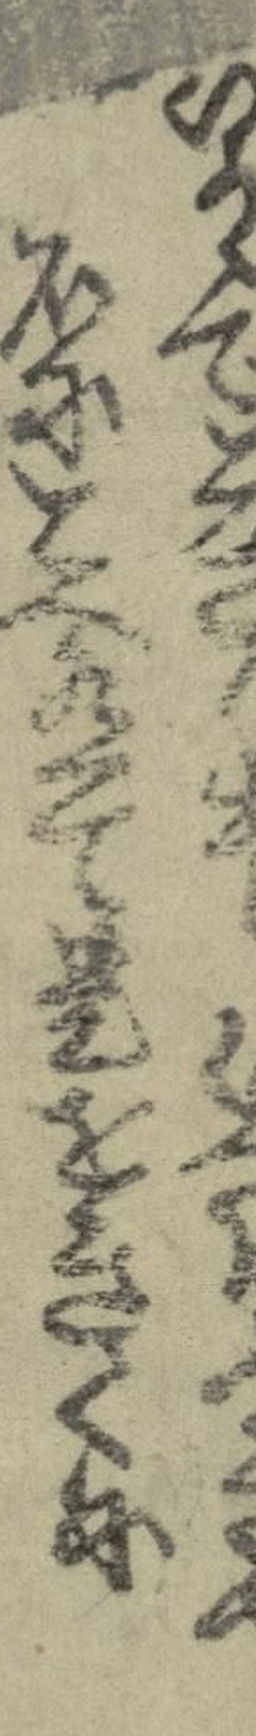石にこへ有て是をきくに
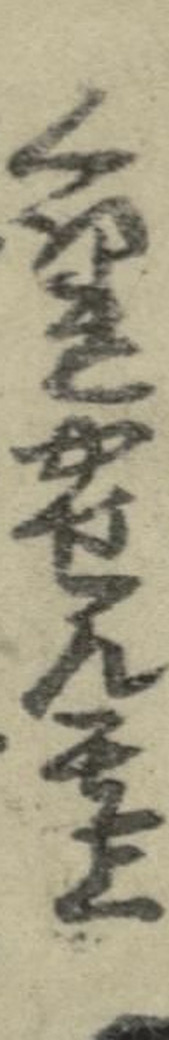くわれやせん其上
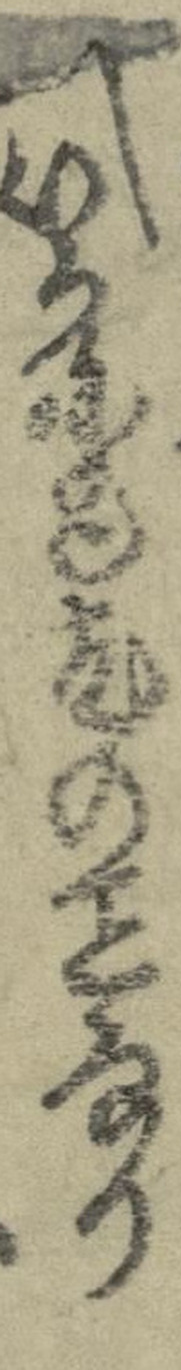〽いかにも尤のことなり
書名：あんしん要石
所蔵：東京大学地震研究所図書室 Earthquake Research Institute Library, The University of Tokyo, JAPAN
